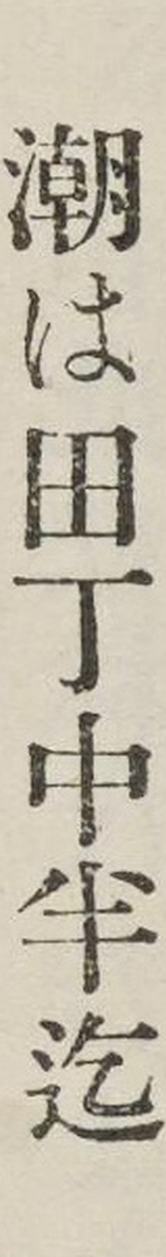十市潮は田丁中半迄
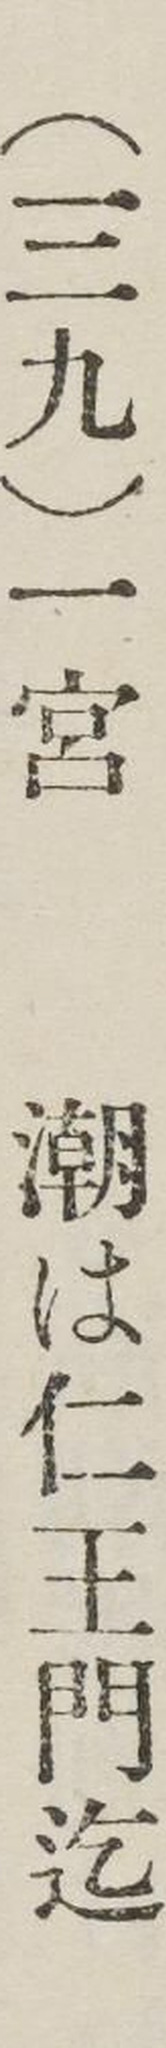一宮潮は仁王門迄
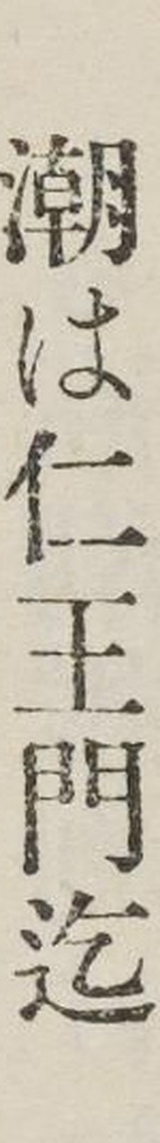一宮潮は仁王門迄
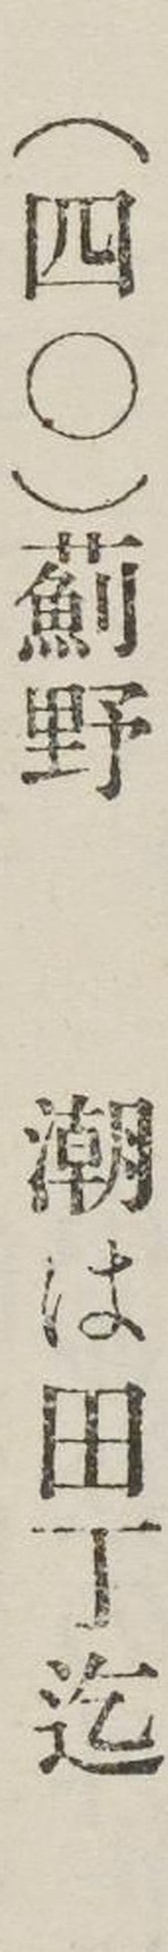薊野潮は田丁迄
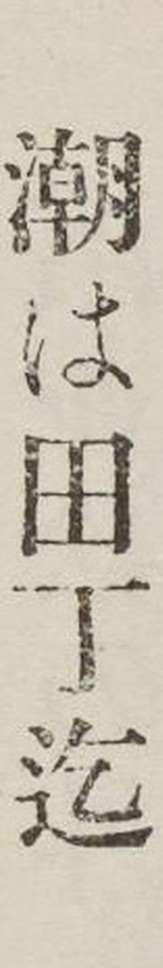薊野潮は田丁迄
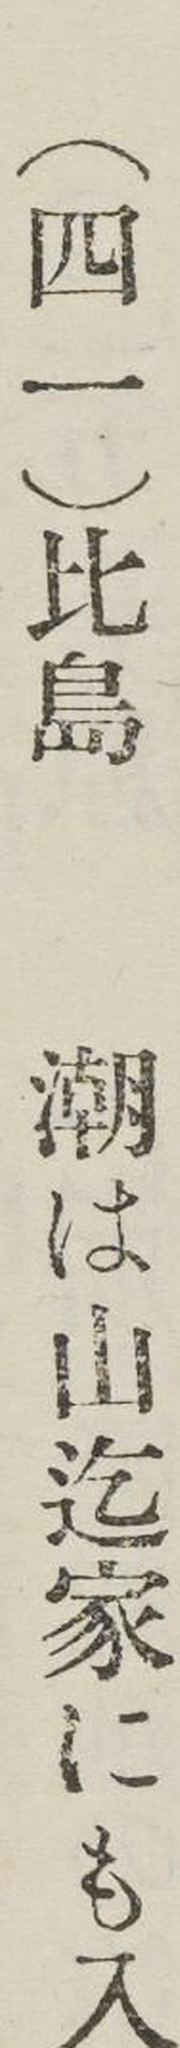比島潮は山迄家にも入
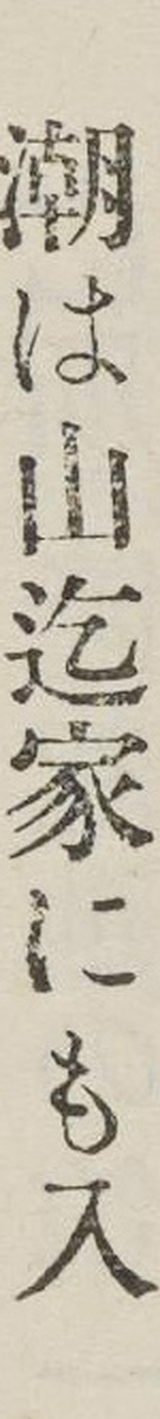比島潮は山迄家にも入
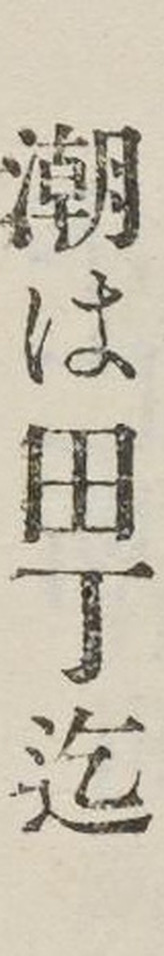薊野潮は田丁迄
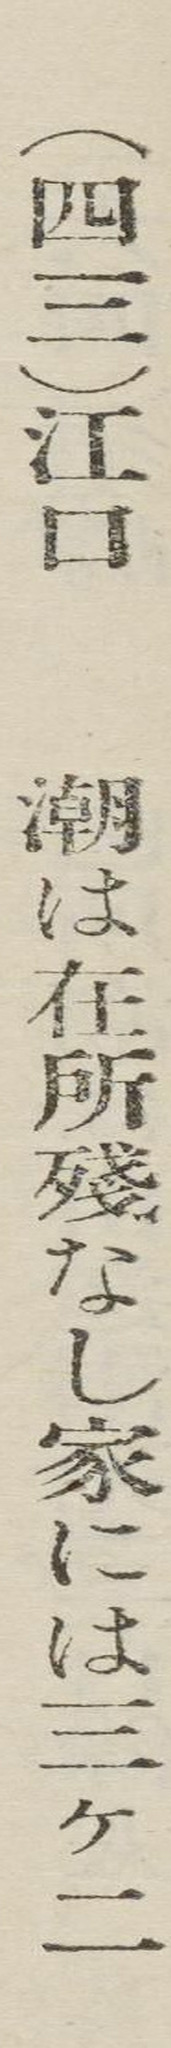江口潮は在所残なし家には三ヶ二
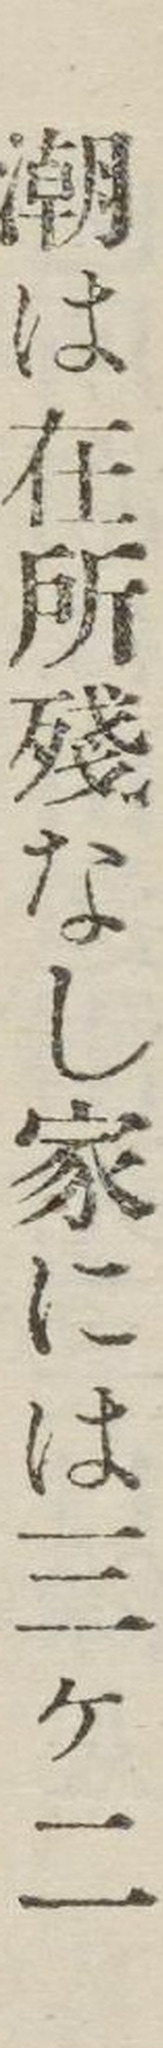江口潮は在所残なし家には三ヶ二
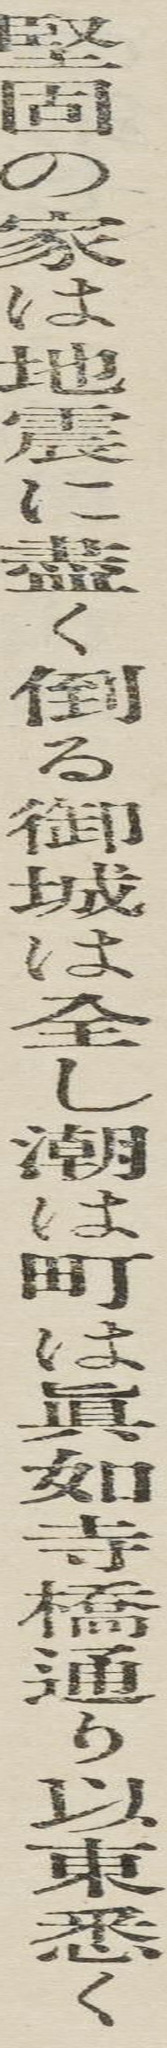高知堅固の家は地震に尽く倒る御城は全し潮は町は眞如寺橋通り以東悉く
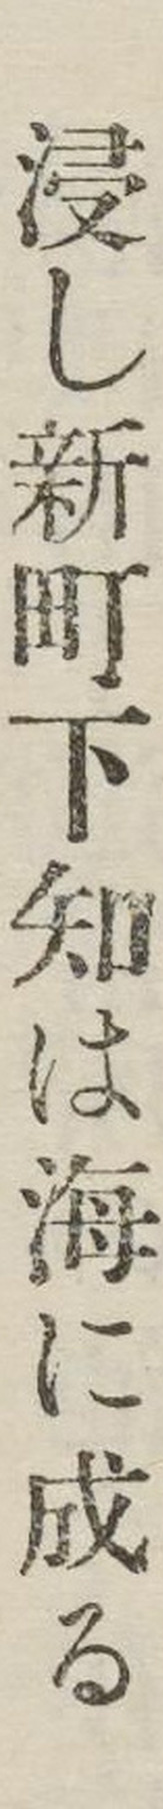浸し新町下知は海に成る
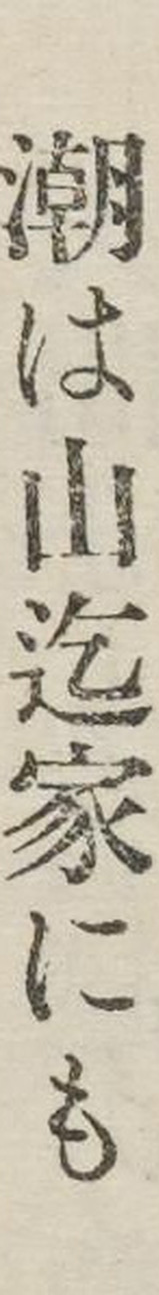潮江潮は山迄家にも
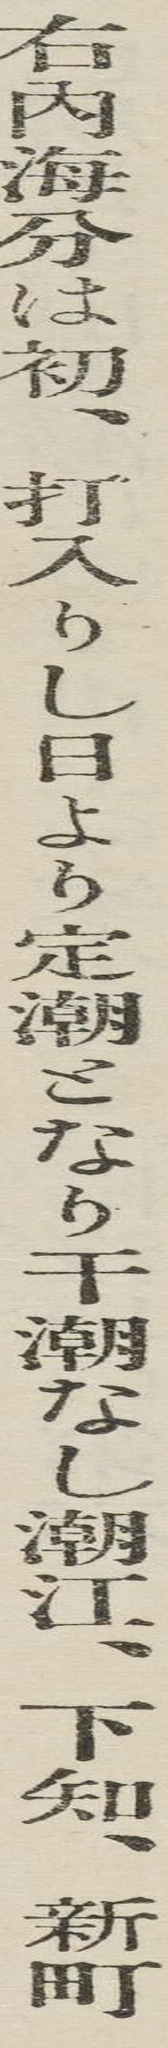右内海分は初、打入りし日より定潮となり干潮なし潮江、下知、新町
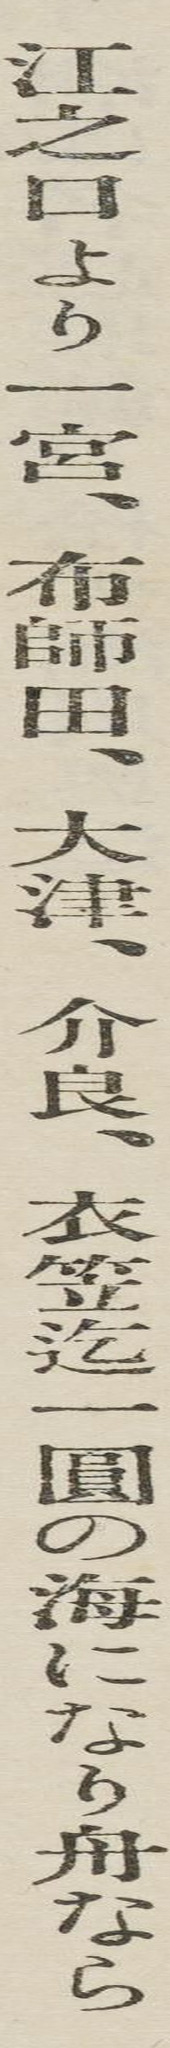江之口より一宮、布師田、大津、介良、衣笠迄一圓の海になり舟なら
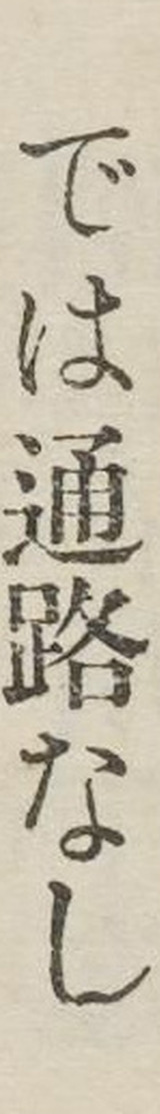では通路なし
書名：土佐古今ノ地震
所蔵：東京大学地震研究所図書室 Earthquake Research Institute Library, The University of Tokyo, JAPAN
